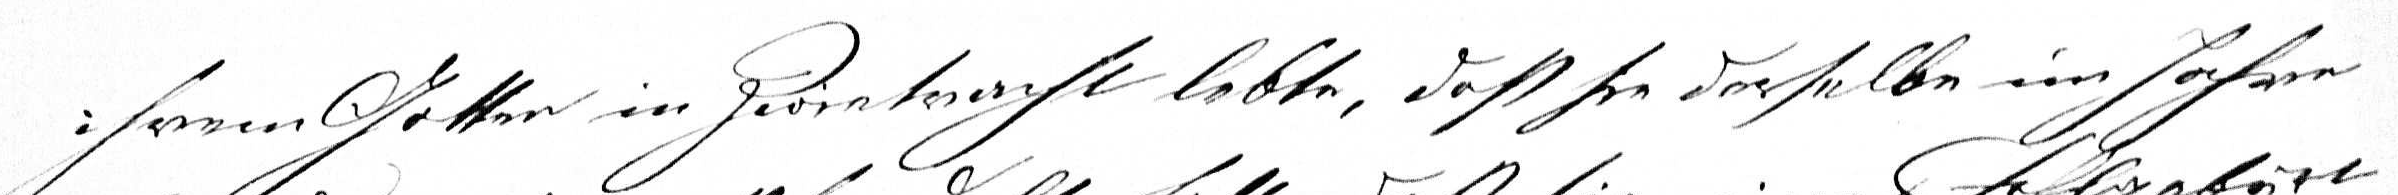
ihrem Gatten in Zweitracht lebte, daß sie derselbe im Jahr
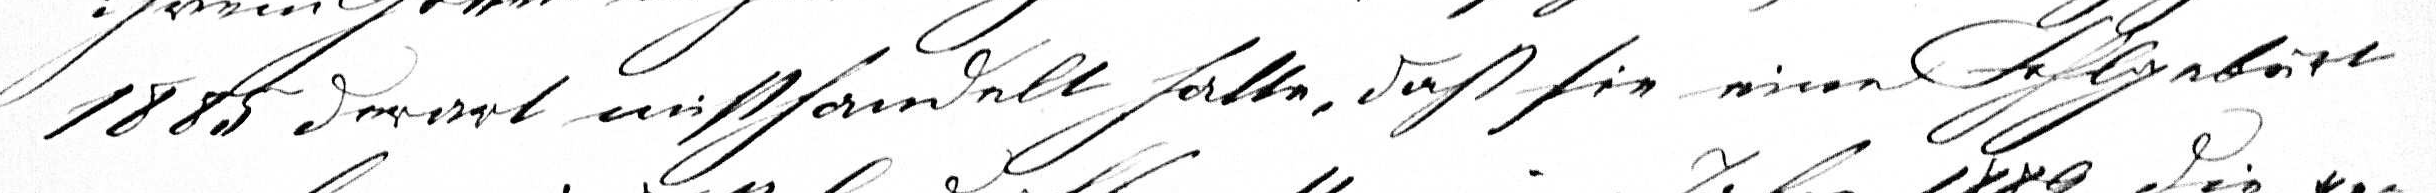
1885 derart mißhandelt hatte, daß sie eine Fehlgeburt
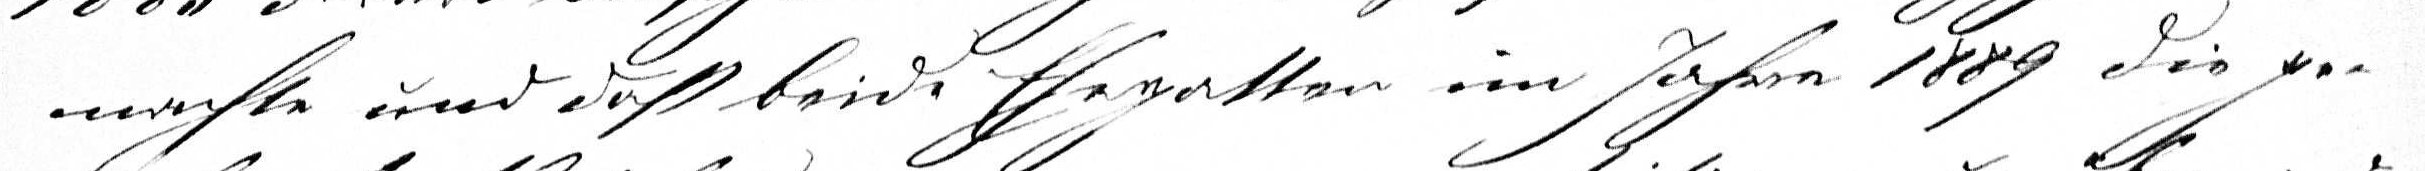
machte und daß beide Ehegatten im Jahre 1889 die ge¬
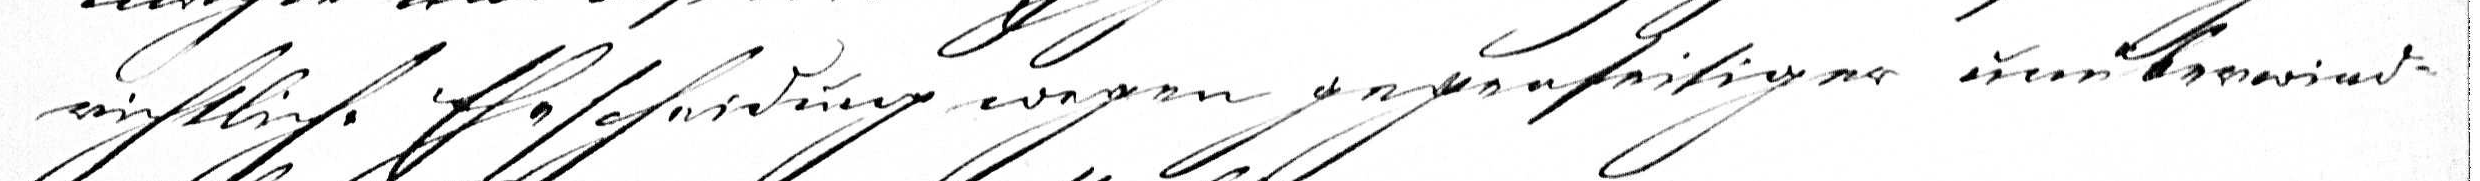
richtliche Ehescheidung wegen gegenseitiger unüberwind¬
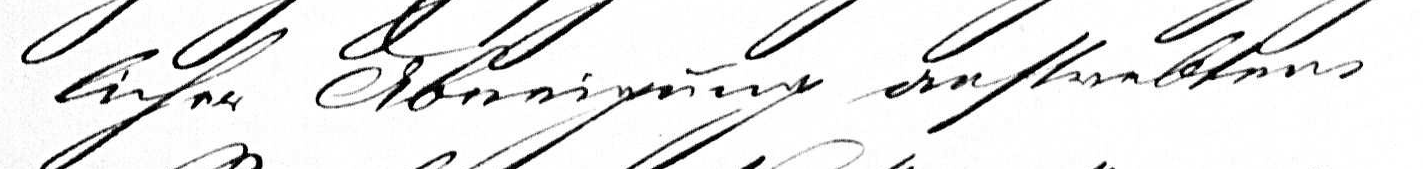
liche Abneigung anstrebten.
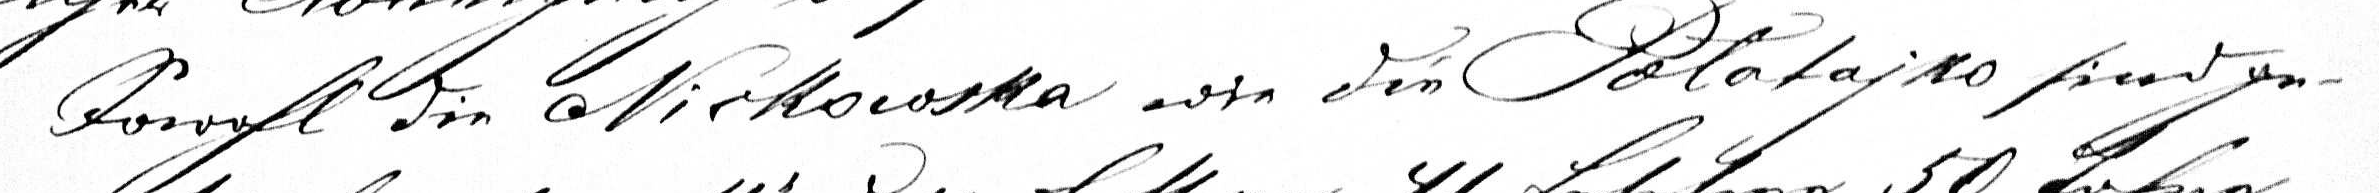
Sowohl die Nickowska wie die Połatajko sind ge¬
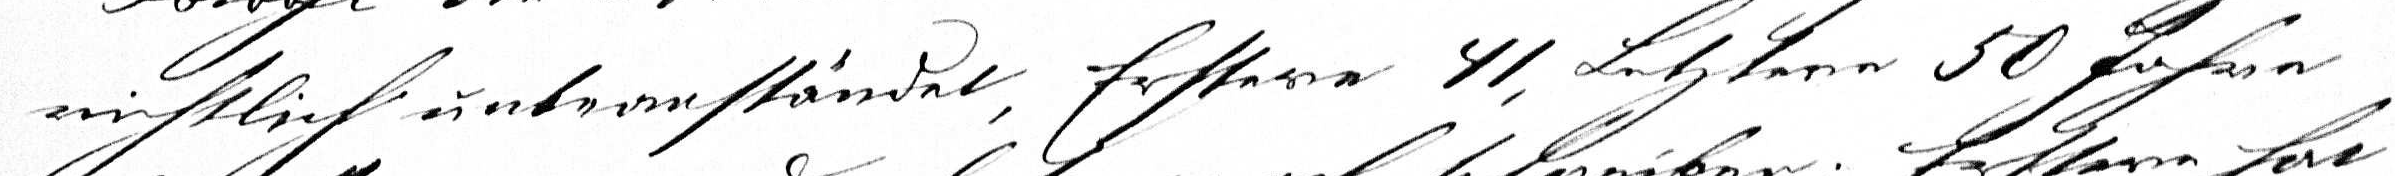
richtlich unbeanständet, Erstere 41, Letztere 50 Jahre
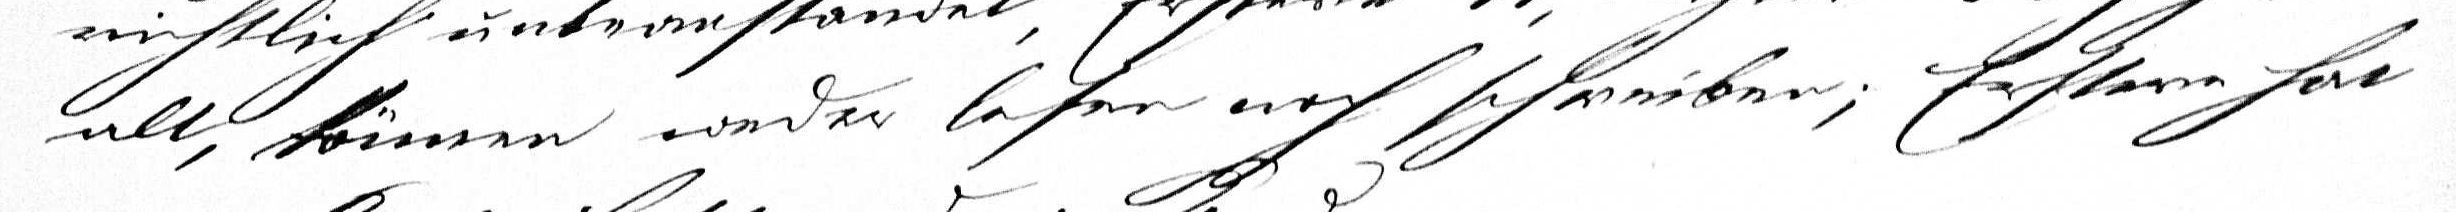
alt, können weder lesen noch schreiben, Erstere hat
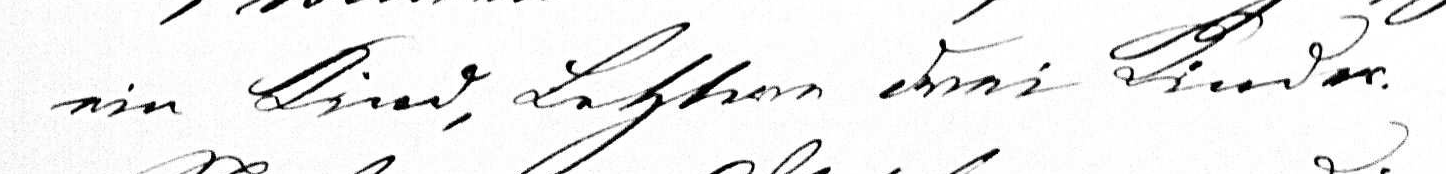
ein Kind, Letztere drei Kinder.
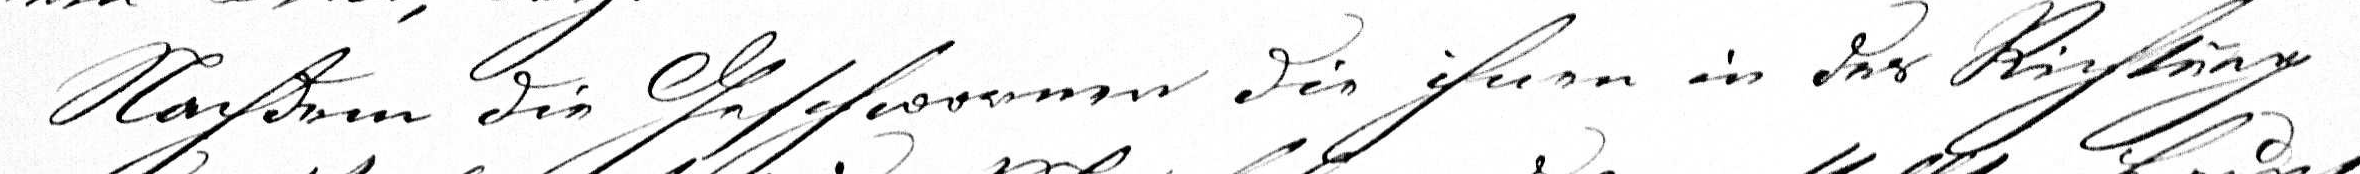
Nachdem die Geschworenen die ihnen in der Richtung
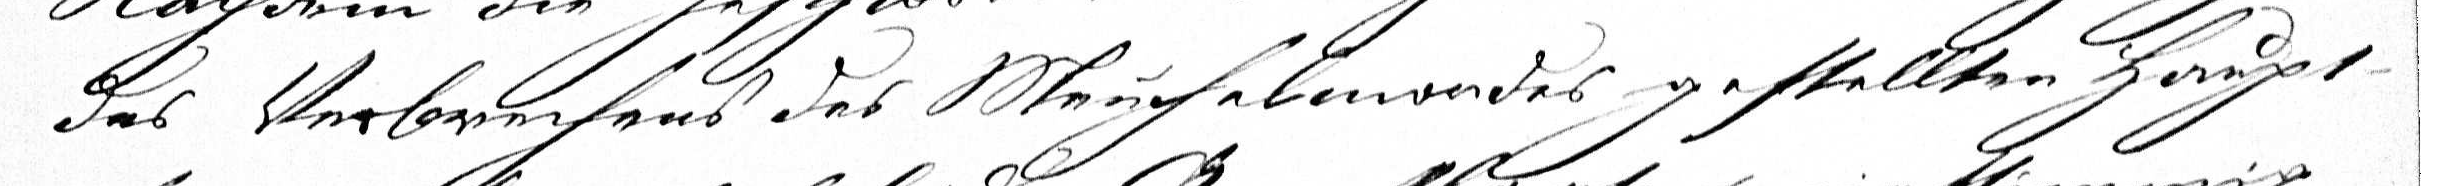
des Verbrechens des Meuchelmordes gestellten Haupt¬
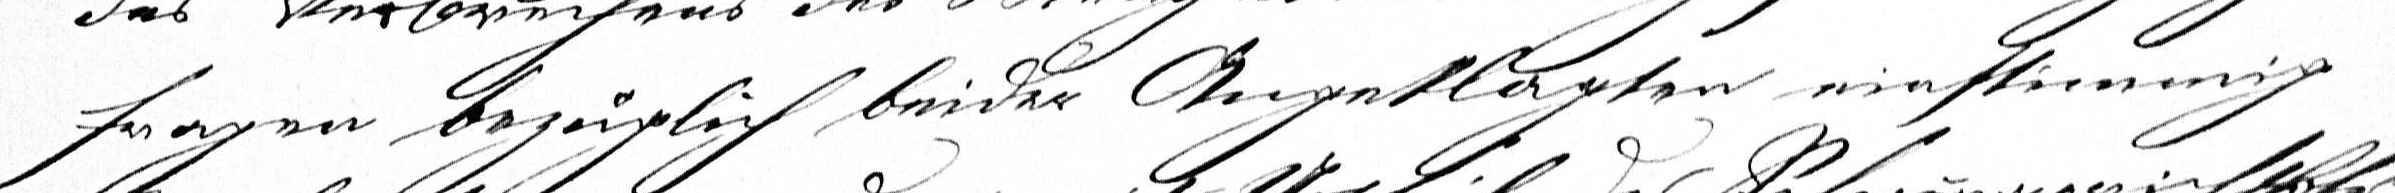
fragen bezüglich beider Angeklagten einstimmig
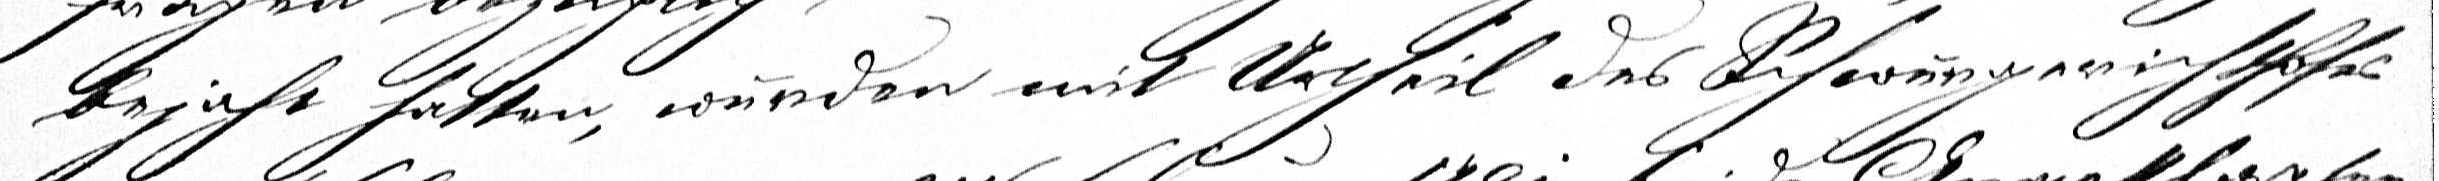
bejaht hatten, wurden mit Urtheil des Schwurgerichtshofes
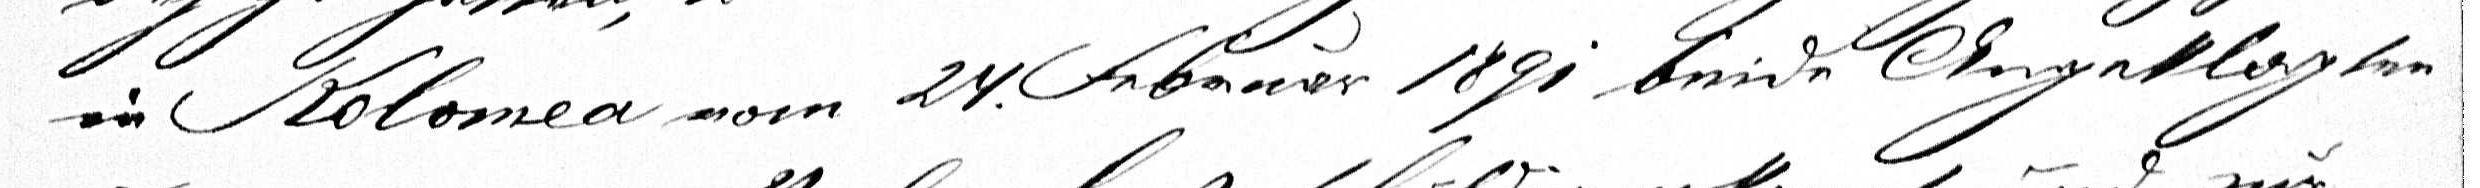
in Kolomea vom 24. Februar 1891 beide Angeklagten
